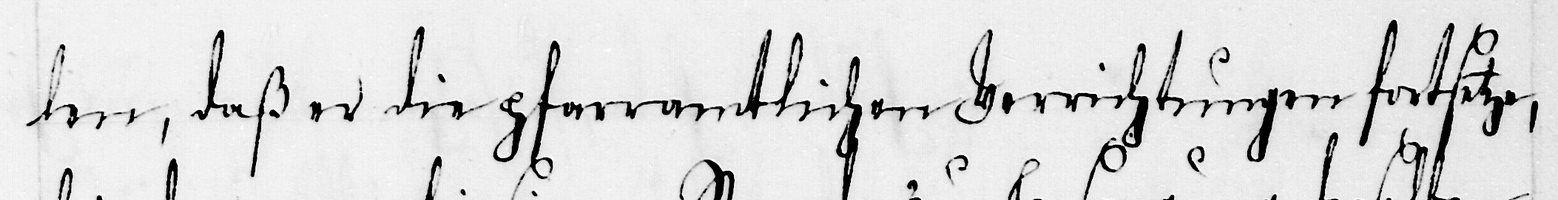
len, daß er die pfarramtlichen Verrichtungen fortsetze,
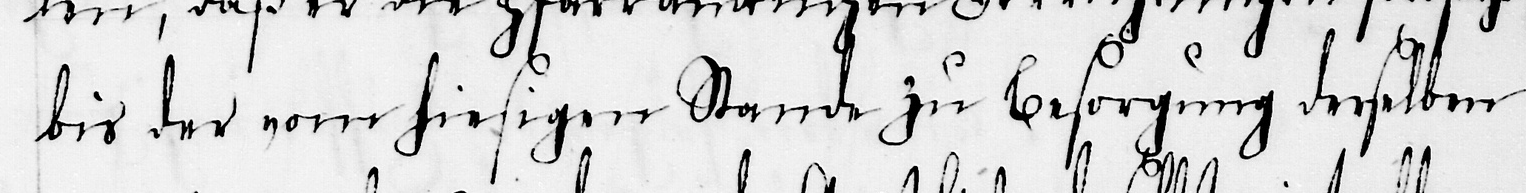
bis der vom hiesigen Stande zu Besorgung derselben
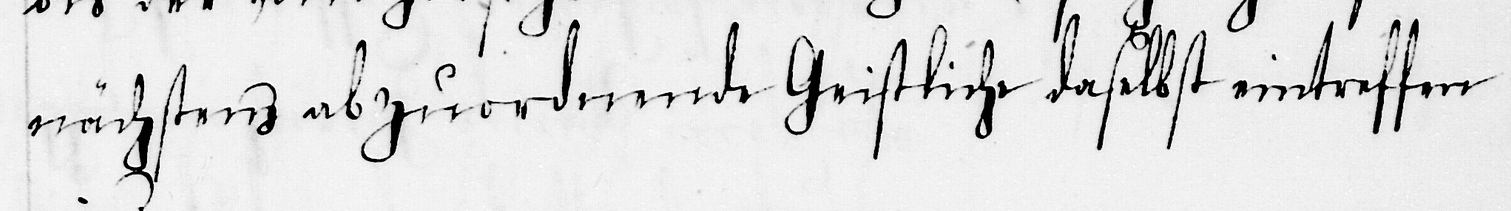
nächstens abzuordnende Geistliche daselbst eintreffen
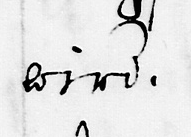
wird.
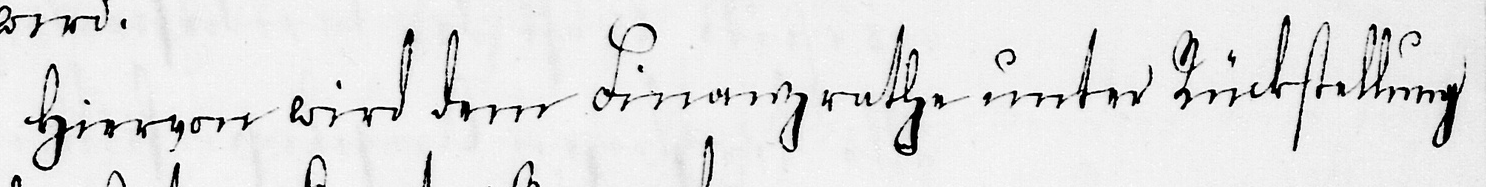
Hiervon wird dem Finanzrathe unter Rückstellung
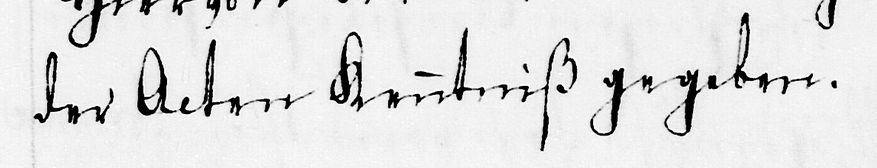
der Acten Kenntniß gegeben.
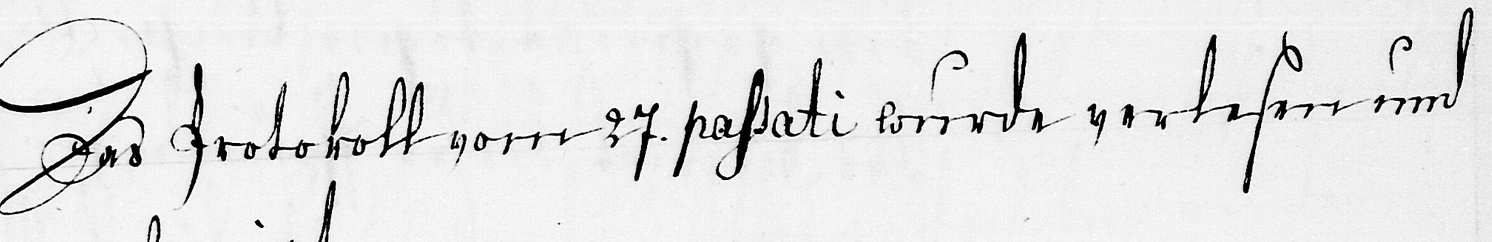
Das Protokoll vom 27. passati wurde verlesen und
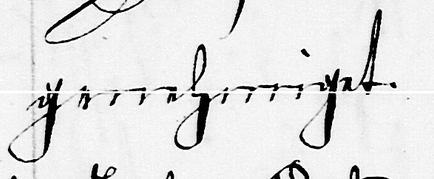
genehmiget.
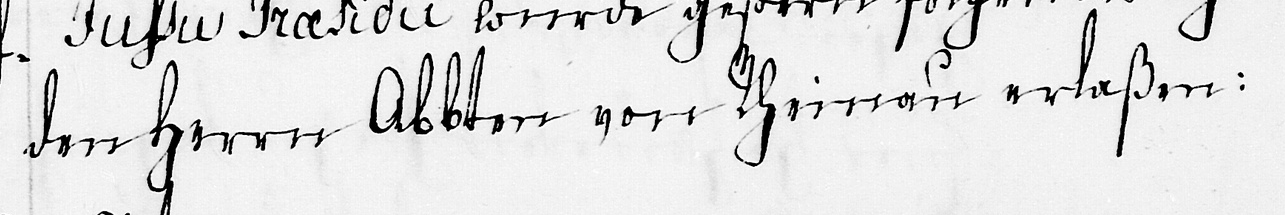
den Herrn Abbten von Rheinau erlaßen:
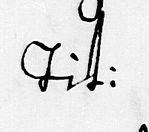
Tit:
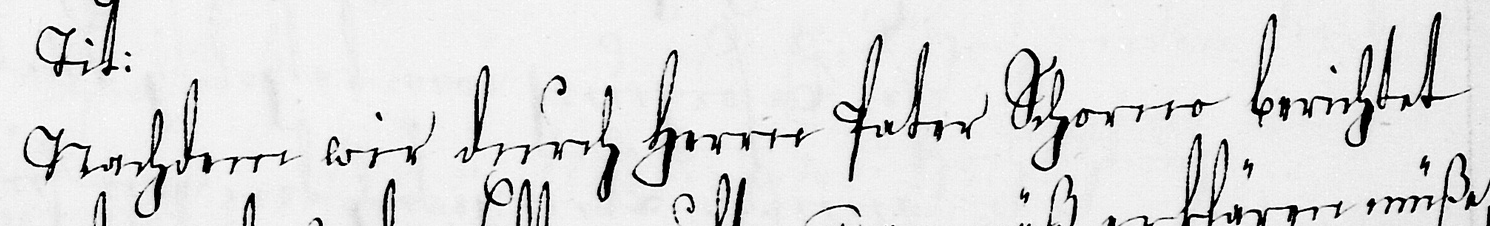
Nachdem wir durch Herrn Pater Schorno berichtet
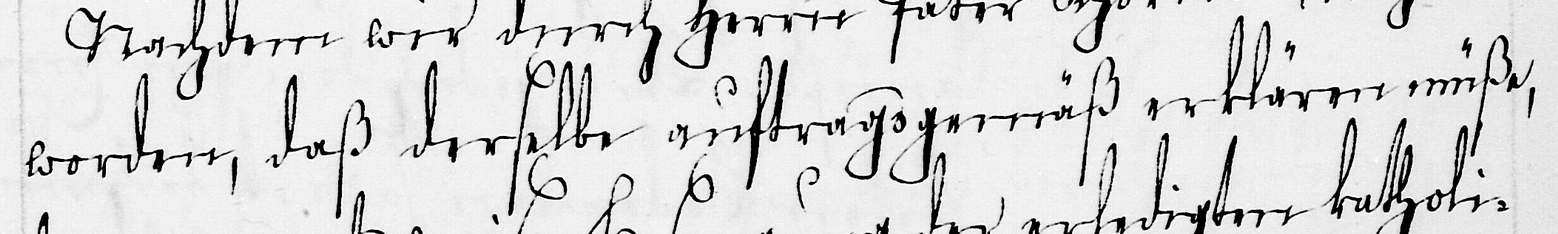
worden, daß derselbe auftragsgemäß erklären müße,
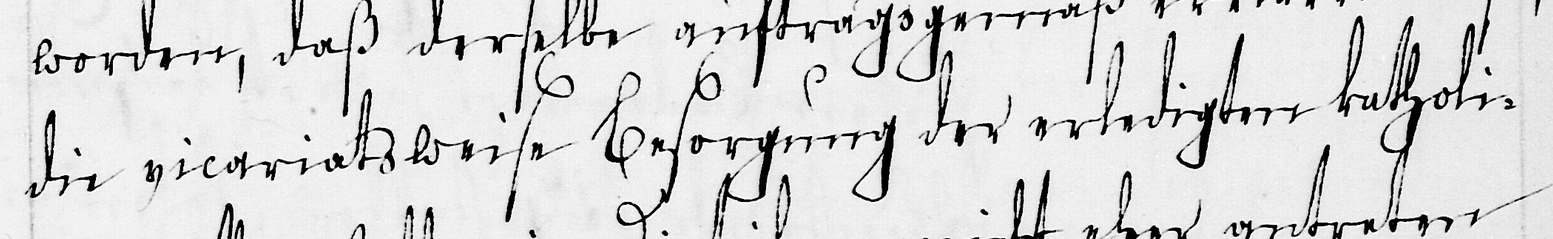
die vicariatsweise Besorgung der erledigten katholi¬
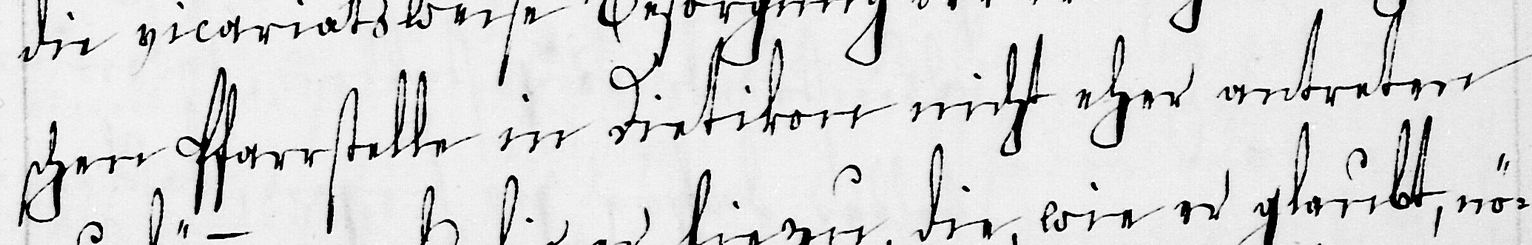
schen Pfarrstelle in Dietikon nicht eher antreten
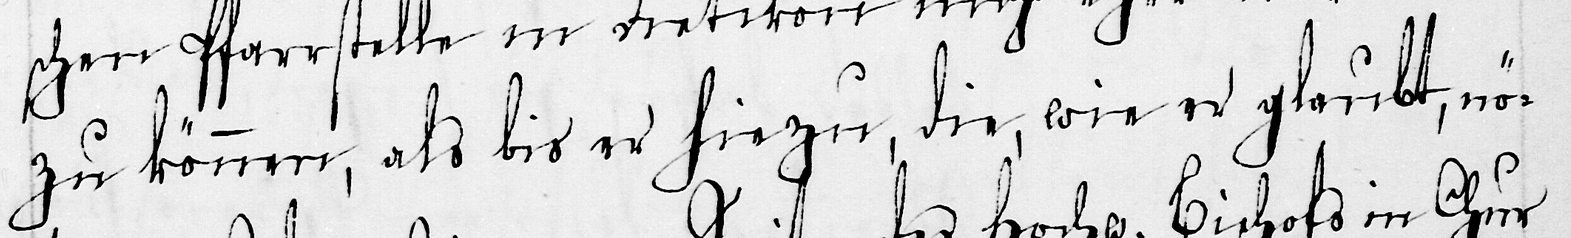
zu können, als bis er hiezu, die, wie er glaubt, nö¬
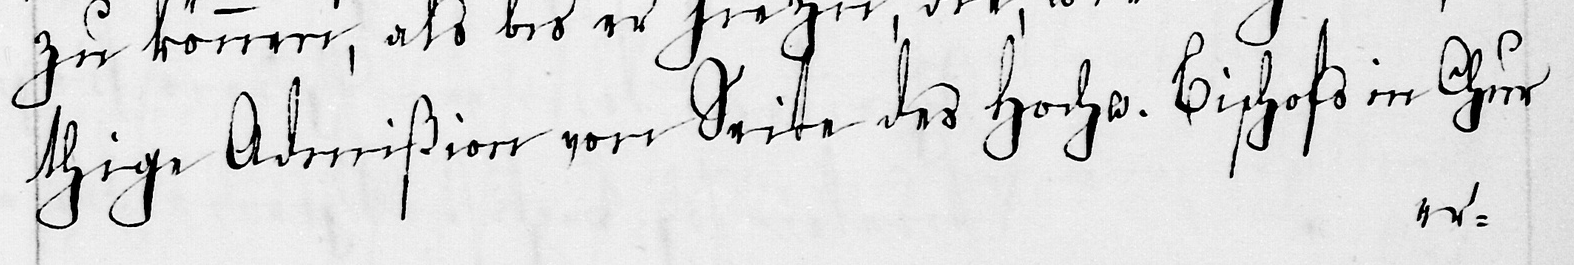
thige Admißion von Seite des Hochw. Bischofs in Chur
